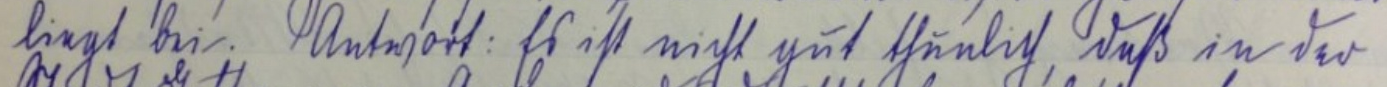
und liegt bei. Antwort: Es ist nicht gut thunlich, daß in der
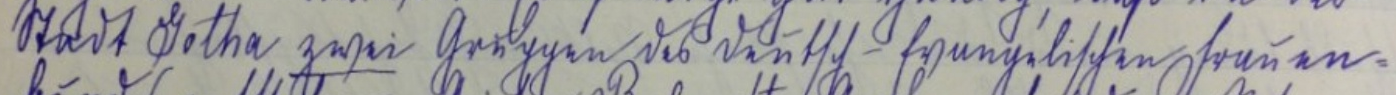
Stadt Gotha zwei Gruppen des Deutsch-Evangelischen Frauen
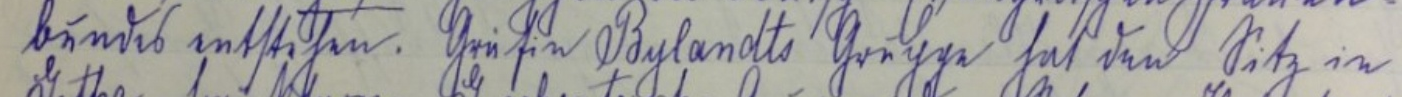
bundes entstehen. Gräfin Bylands Gruppe hat den Sitz in
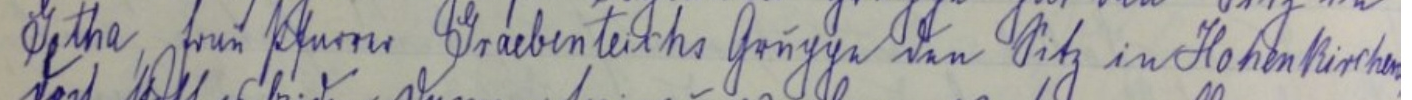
Gotha, Frau Pfarrer Graebenteichs Gruppe den Sitz in Hohenkirchen
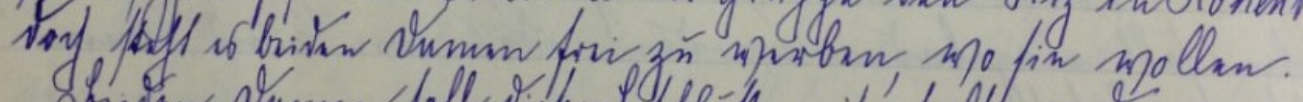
doch steht es beiden Damen frei zu werben wo sie wollen.
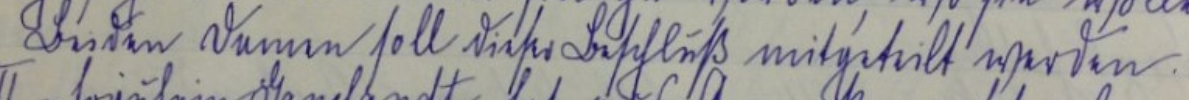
Beiden Damen soll dieser Beschluß mitgeteilt werden.
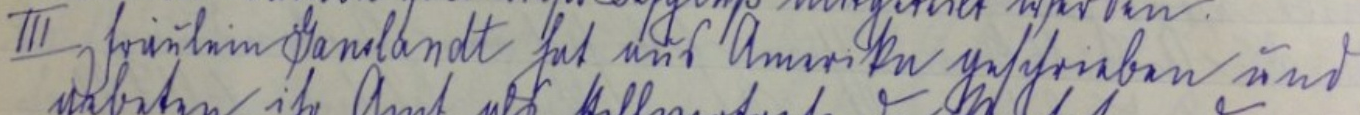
III Fräulein Ganslandt hat aus Amerika geschrieben und
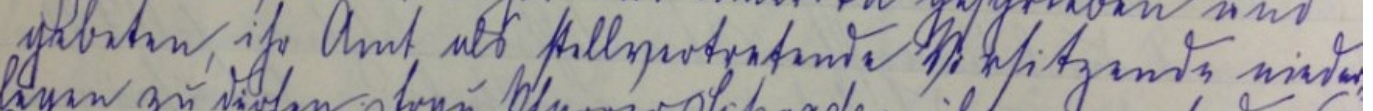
gebeten, ihr Amt als Stellvertretende Vorsitzende nieder
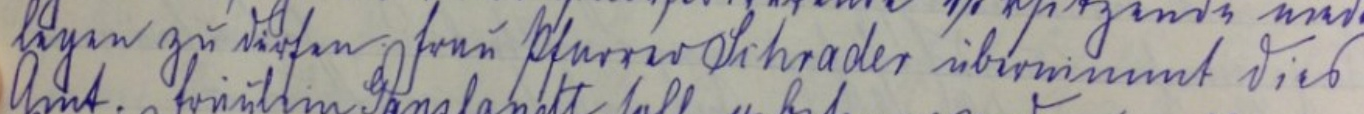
legen zu dürfen. Frau Pfarrer Schrader übernimmt dies
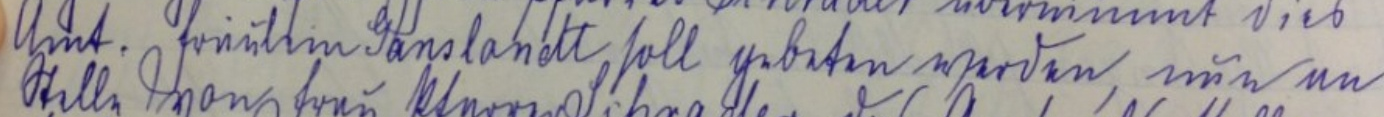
Amt. Fräulein Ganslandt soll gebeten werden nun an
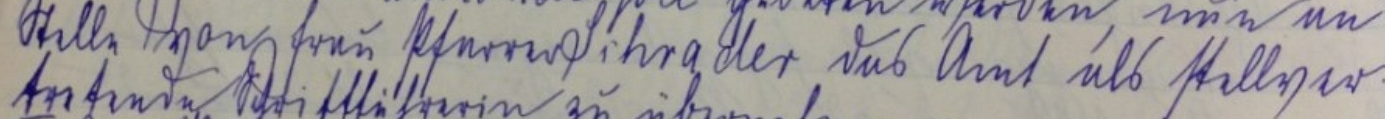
Stelle von Frau Pfarrer Schrader das Amt als Stellver
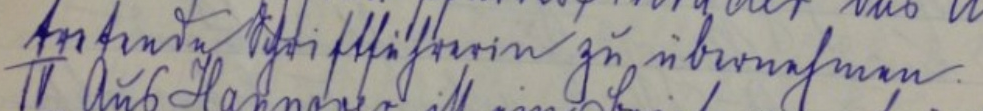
tretende Schriftführerin zu übernehmen.
